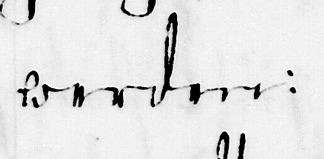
werden:
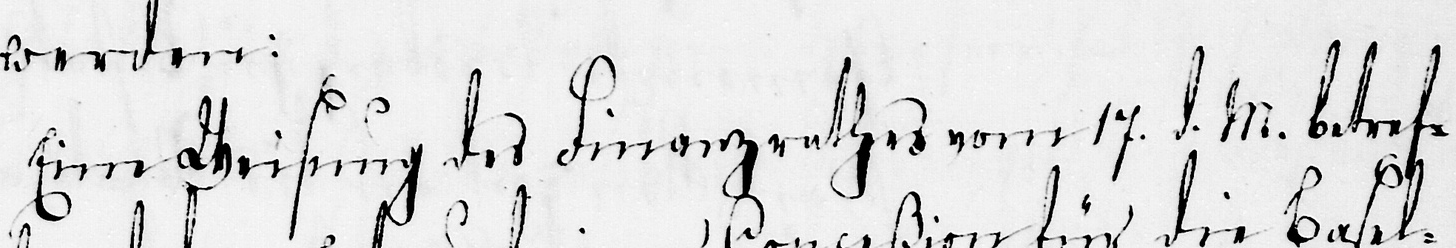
Eine Weisung des Finanzrathes vom 17. d. M. betref¬
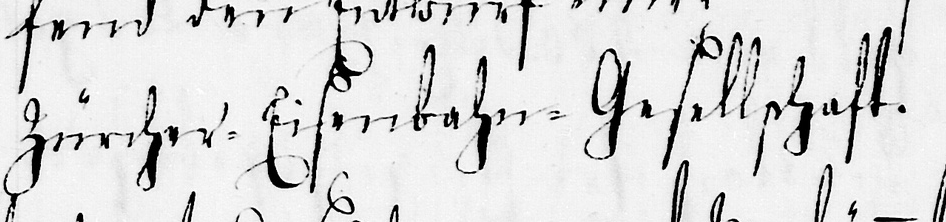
ürcher-Eisenbahn-Gesellschaft.
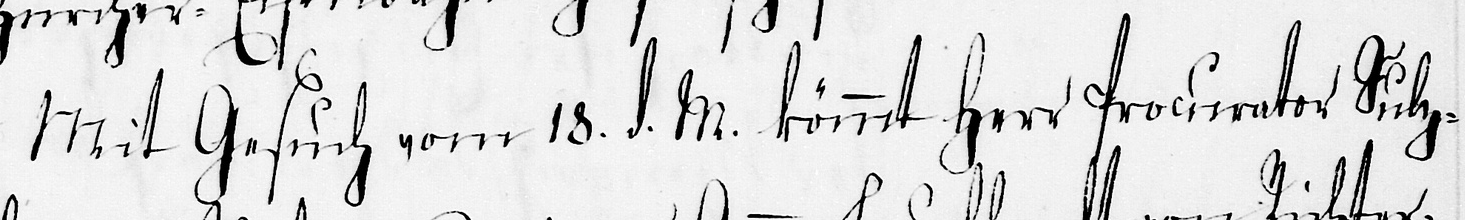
Mit Gesuch vom 18. d. M. kömmt Herr Procurator Sulz¬
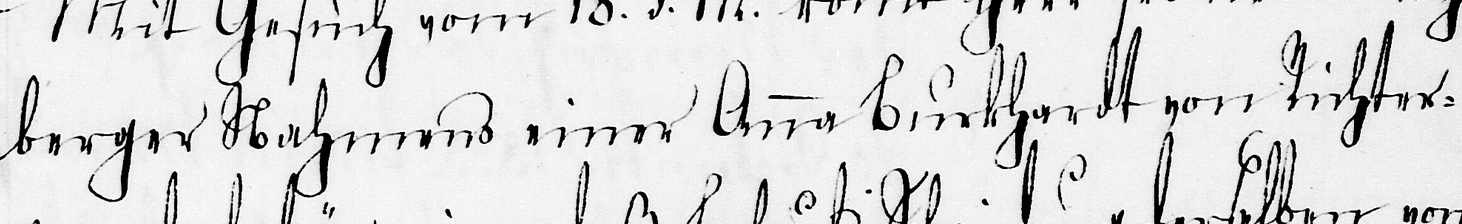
berger Nahmens einer Anna Burkhardt von Richter¬
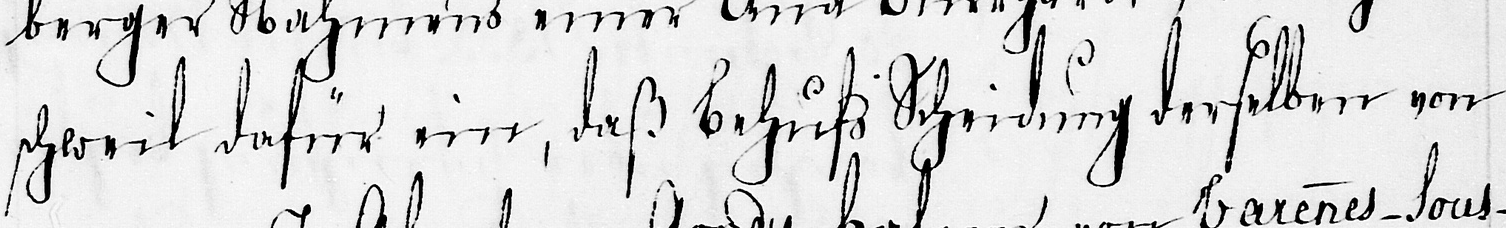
schweil dafür ein, daß Behufs Scheidung derselben von
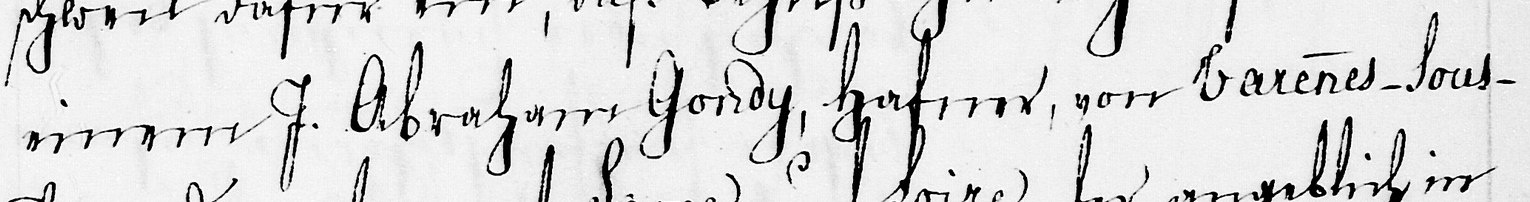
einem J. Abraham Gondy, Hafner, von Varennes-Sou¬
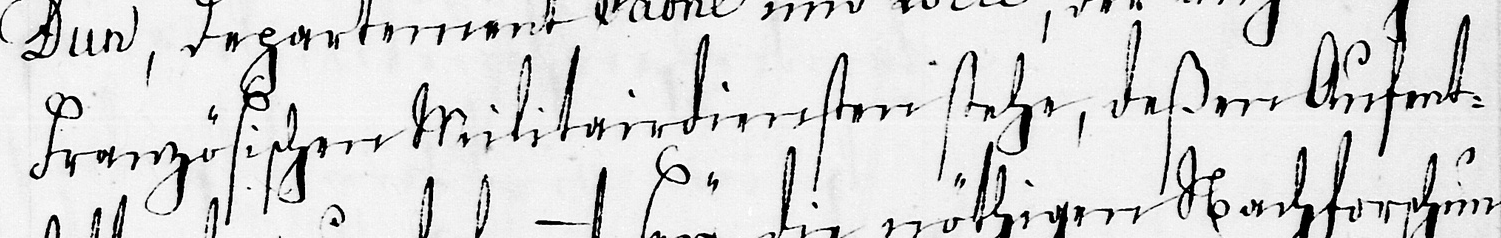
Französischen Militairdiensten stehe, deßen Aufent¬
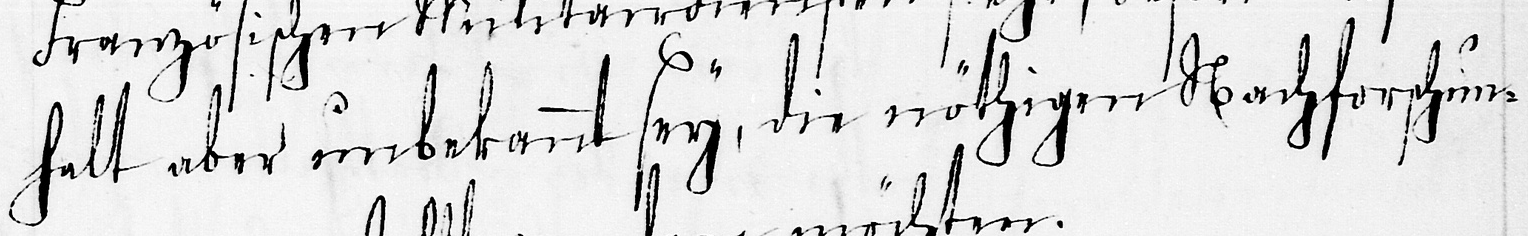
halt aber unbekannt sey, die nöthigen Nachforschun¬
